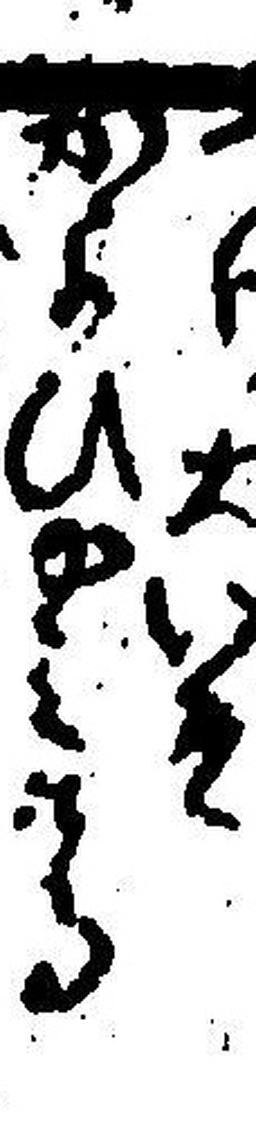かよひやみける
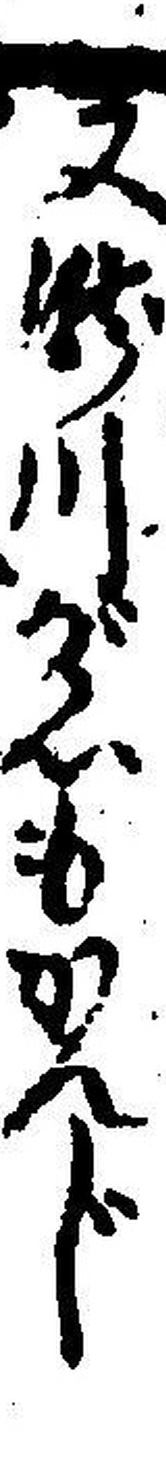又滝川が心もかんじ
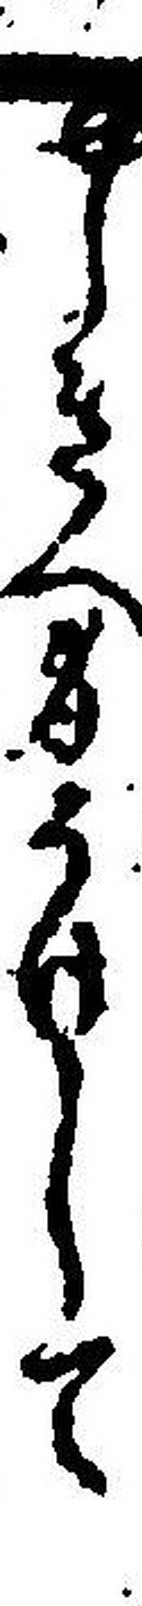やしきへ身うけして
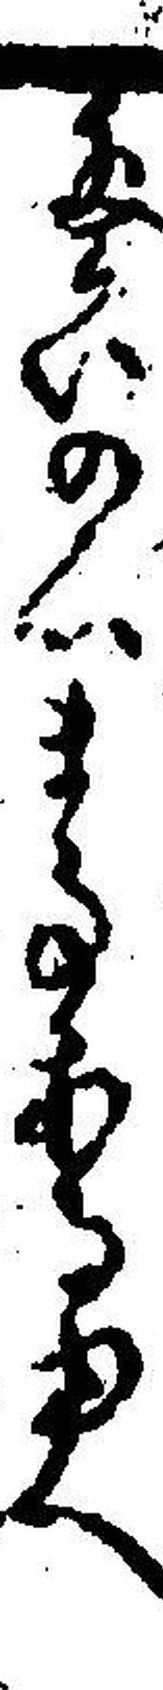たかいの心ま事あるゆへ
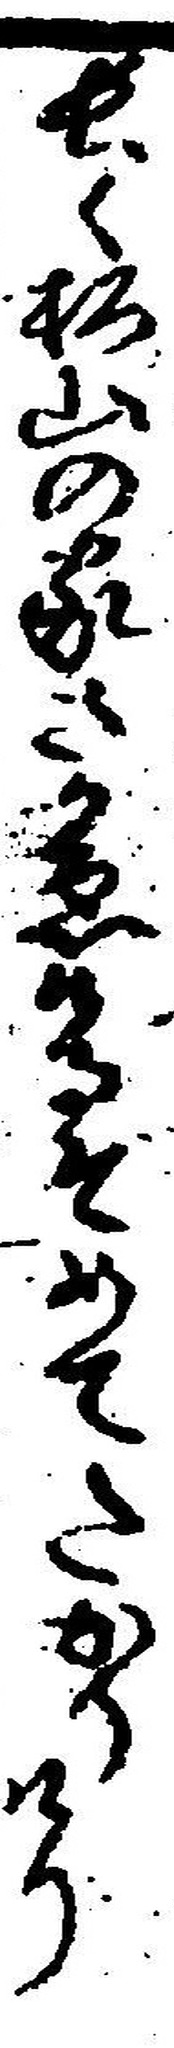長く松山の家さかゑけるぞめてたかり
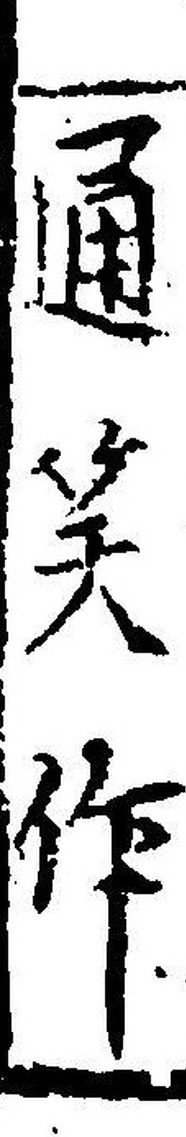通笑作
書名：御代参牛時詣 / 市場通笑作
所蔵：東京大学総合図書館 General Library in the University of Tokyo, JAPAN
